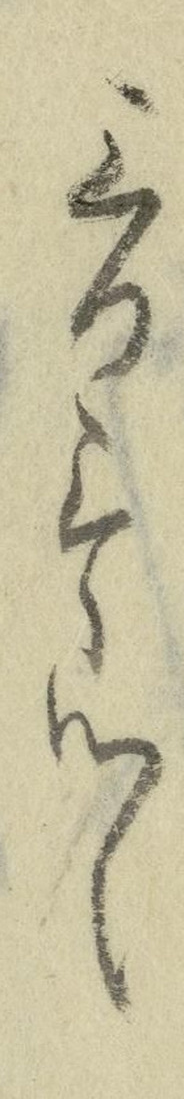三百三十弐文

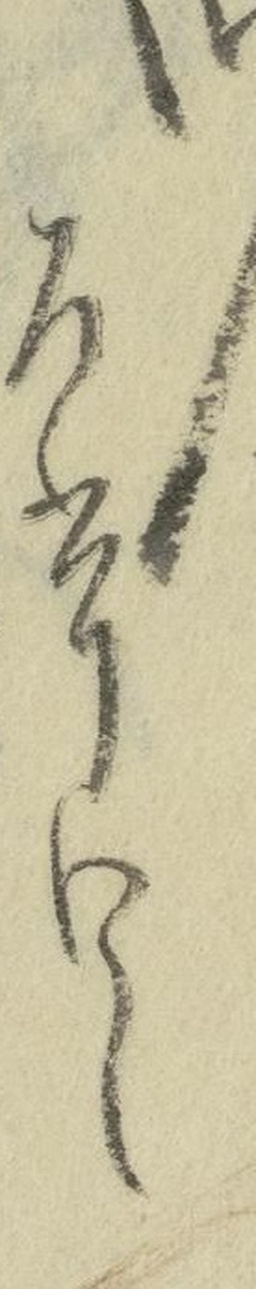百六十四文
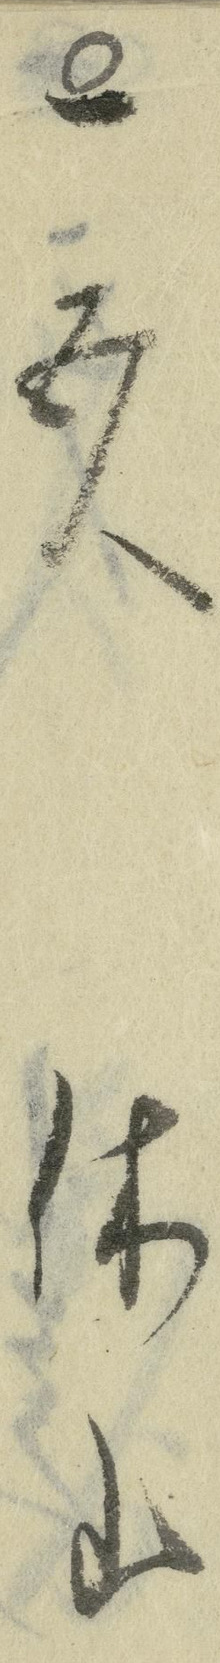○一五人休山
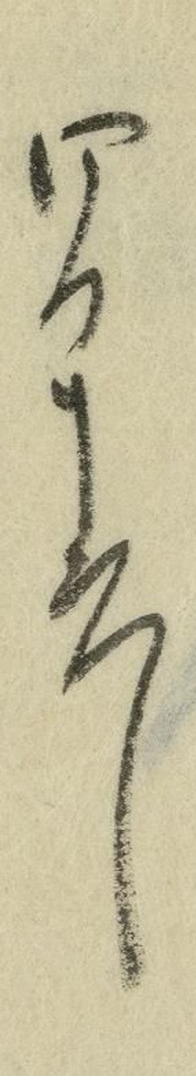四百十六文
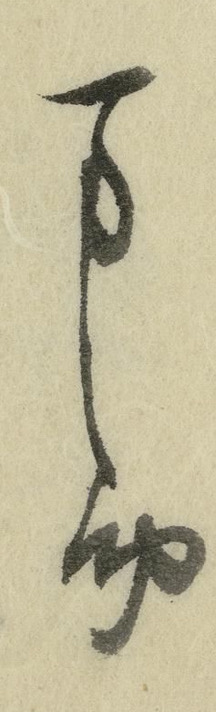辰之助
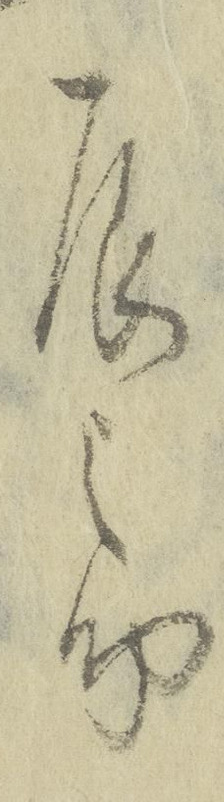辰之助
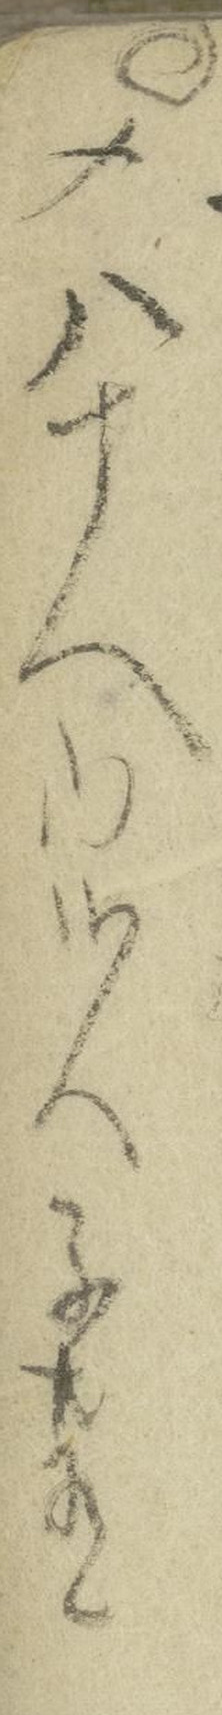〆八十人内弐人子共有

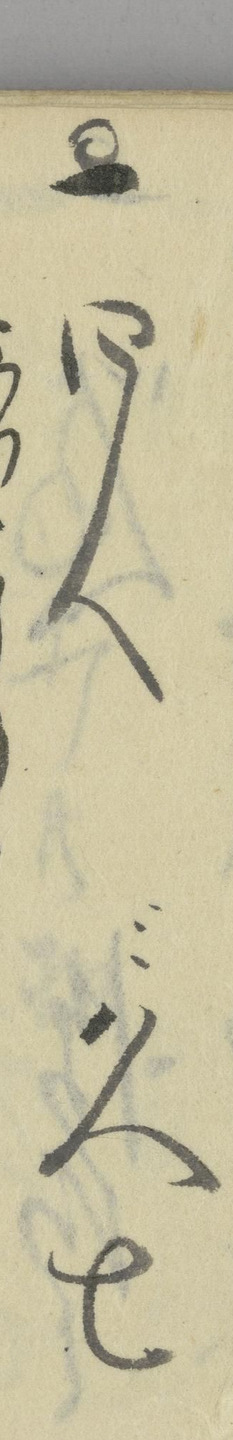○一四人店
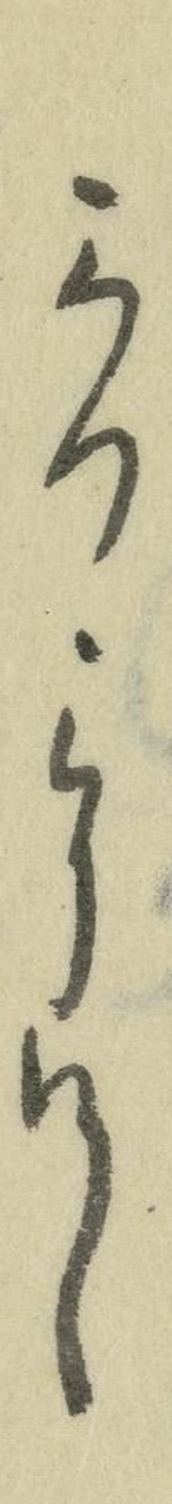三百三十弐文
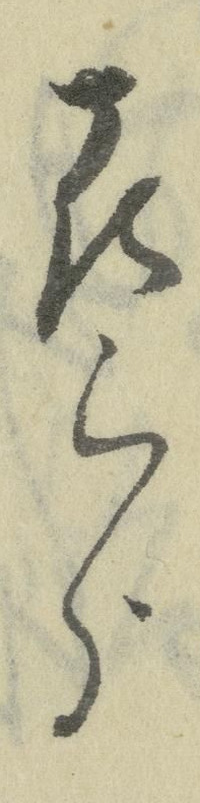喜三郎
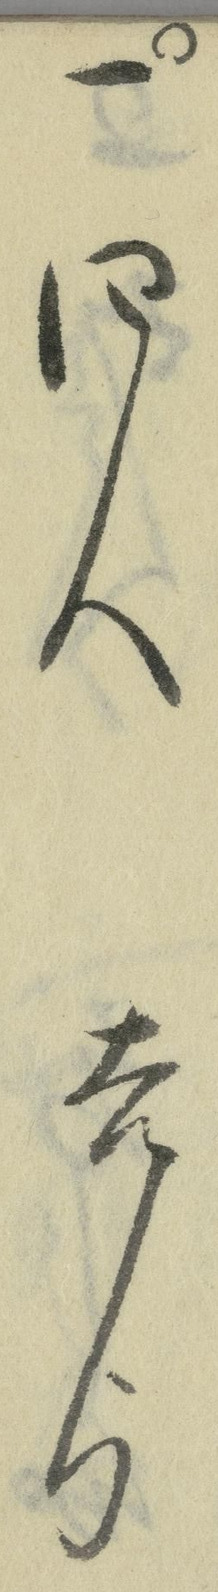○一四人吉右衛門
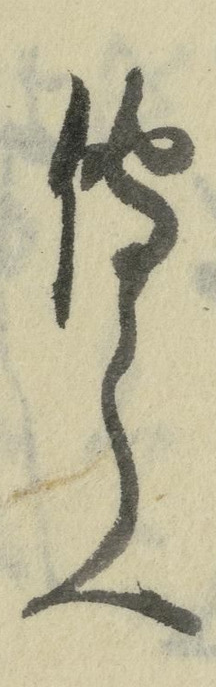十兵衛
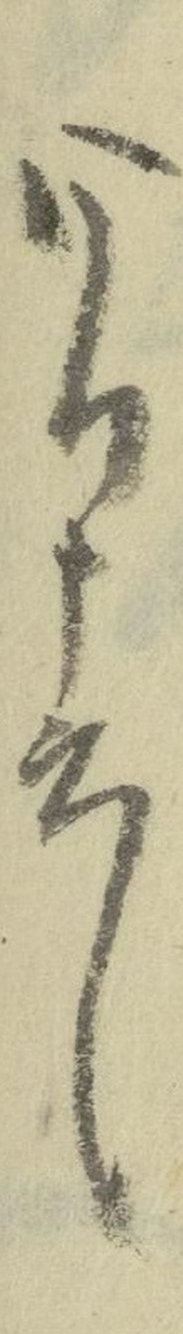四百十六文
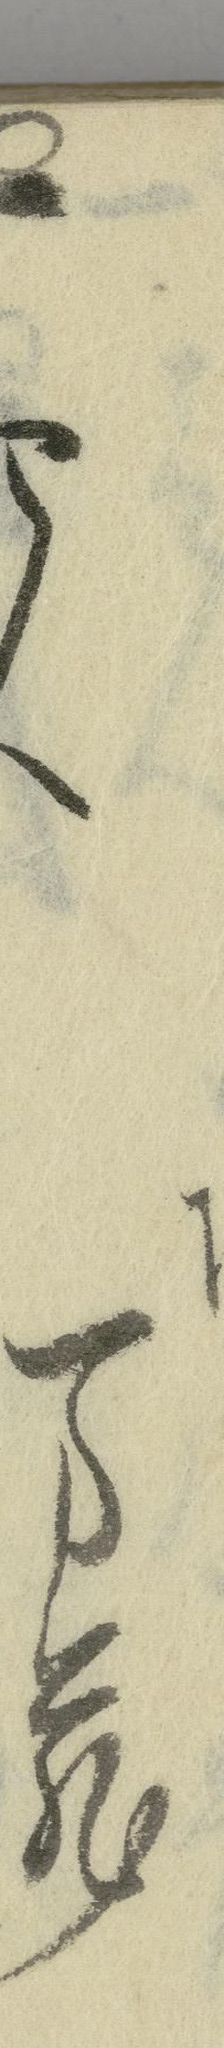○一四人久七

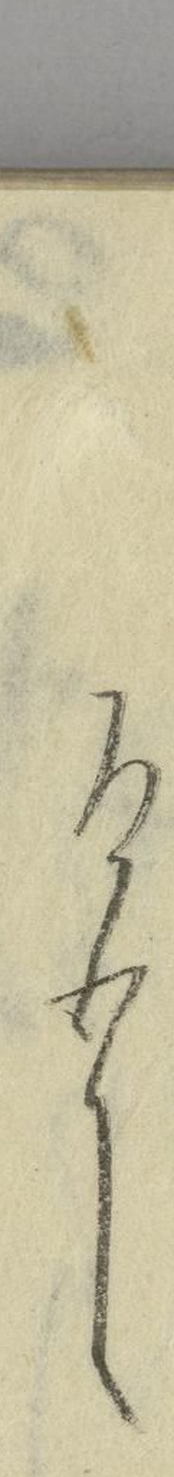百五十文
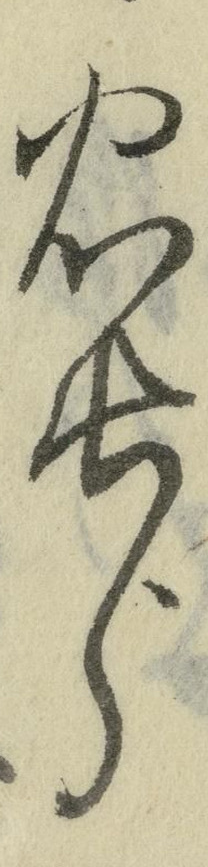武右衛門
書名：天明淺間噴火ニ関スル書類
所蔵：東京大学地震研究所図書室 Earthquake Research Institute Library, The University of Tokyo, JAPAN
